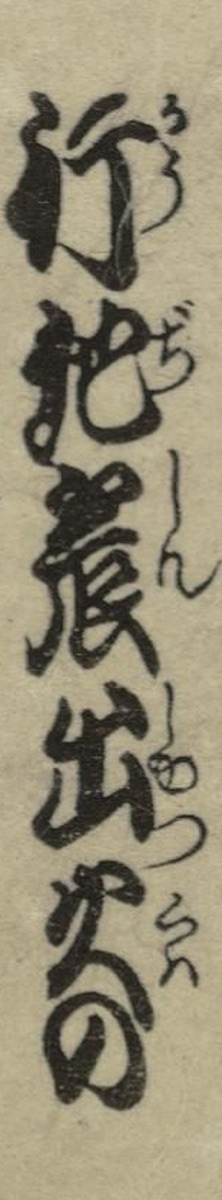行地震出火の
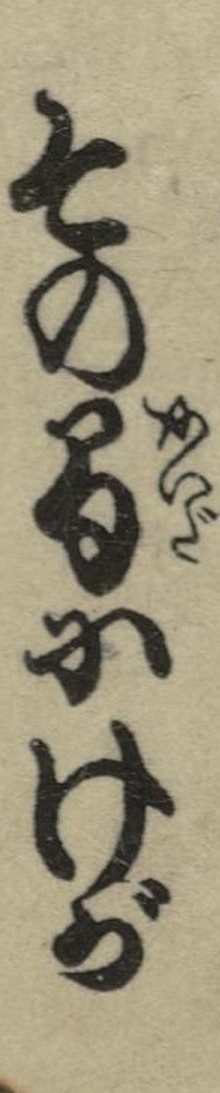その間にけが
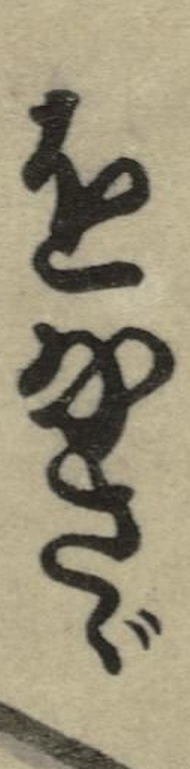をなさゞ
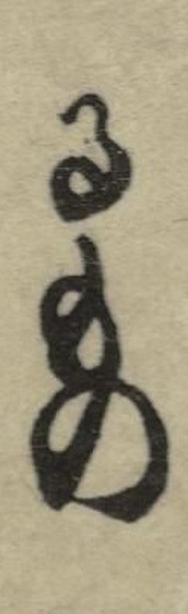るもの
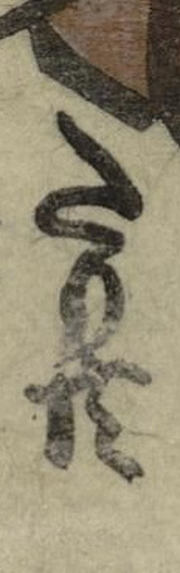たり共
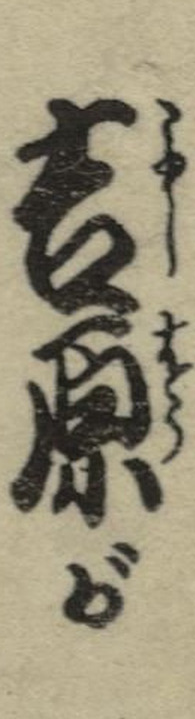𠮷原が
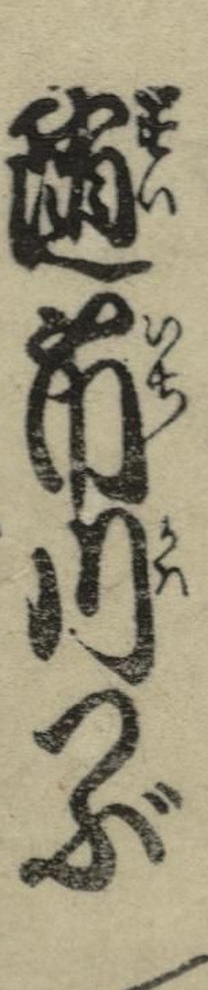随市川つぶ
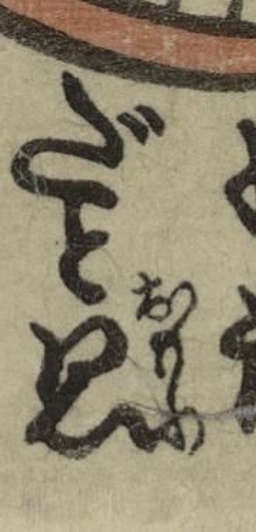だと思
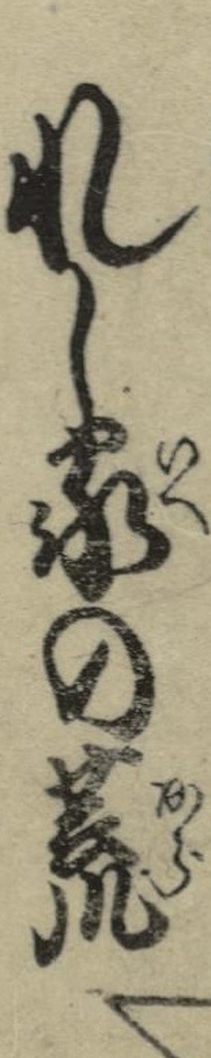れし家の荒
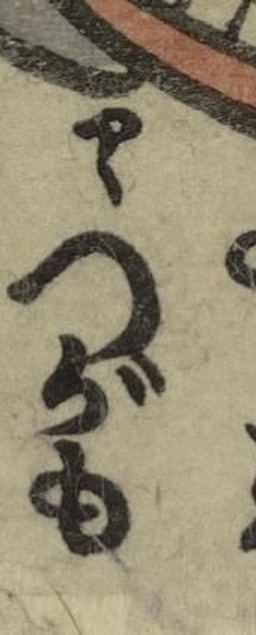アヽつがも
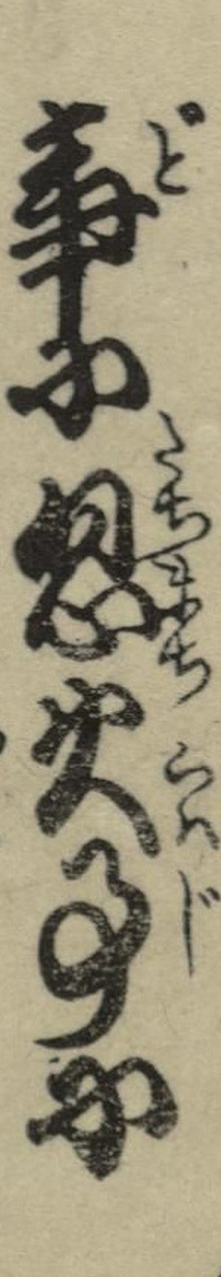事に忽火事に
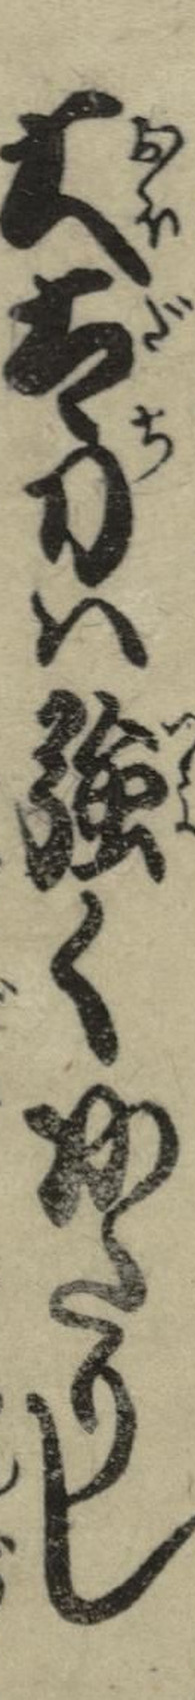大太刀は強くあたりし
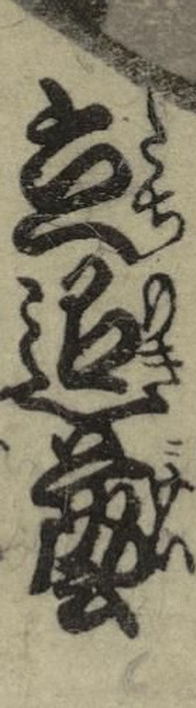立退芸
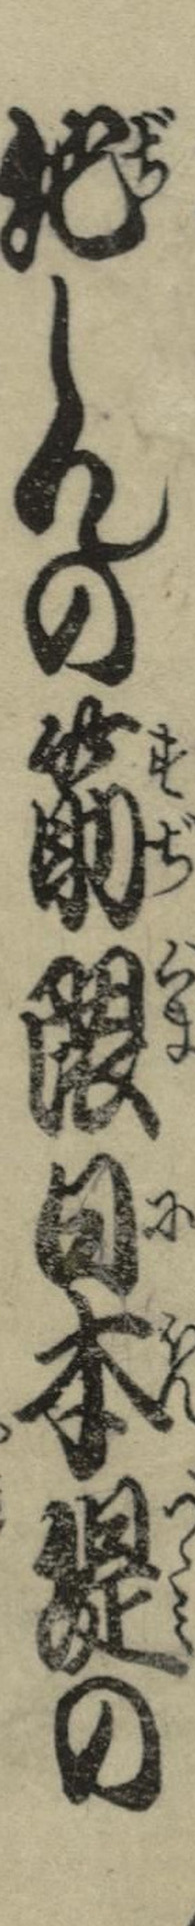地しんの筋隈日本堤の
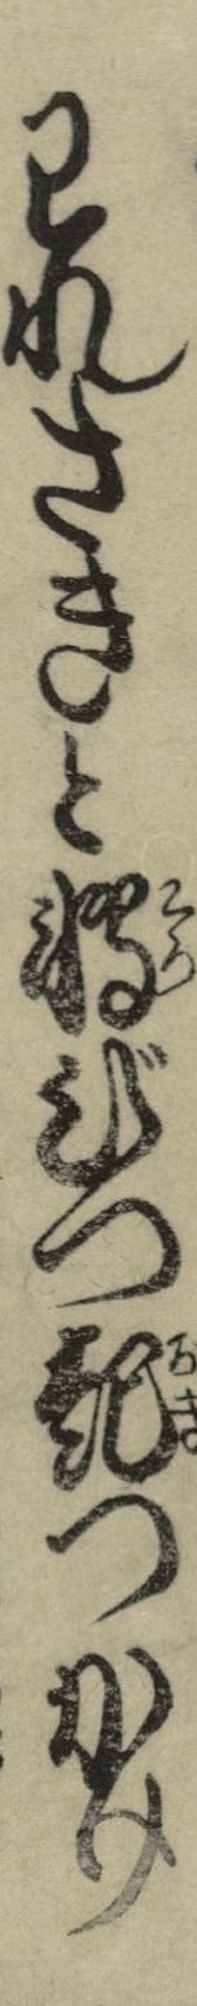われさきと転びつ起つかけ
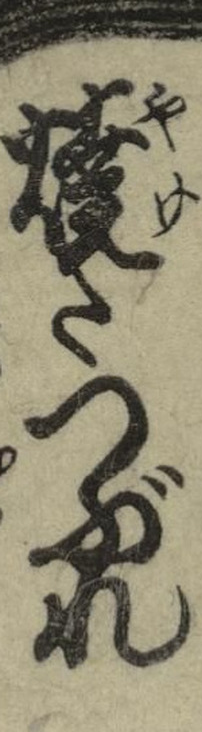焼たつぶれ
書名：しばらくのそとね
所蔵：東京大学地震研究所図書室 Earthquake Research Institute Library, The University of Tokyo, JAPAN
